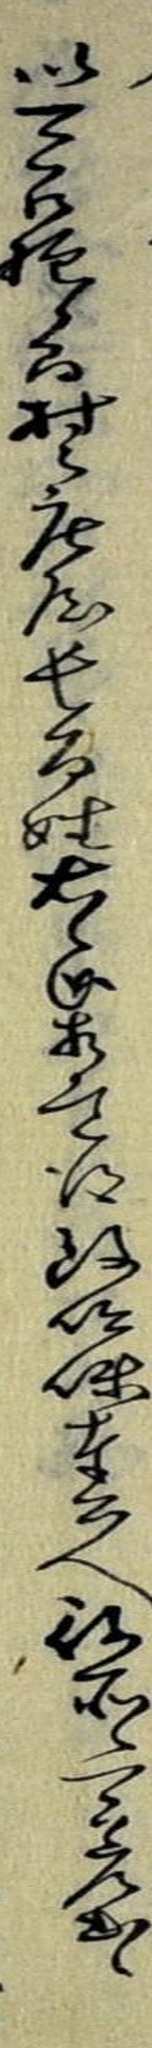以可召抱候間村々庄屋長百姓右之趣相意得致吟味奉公人役所へ可差出候
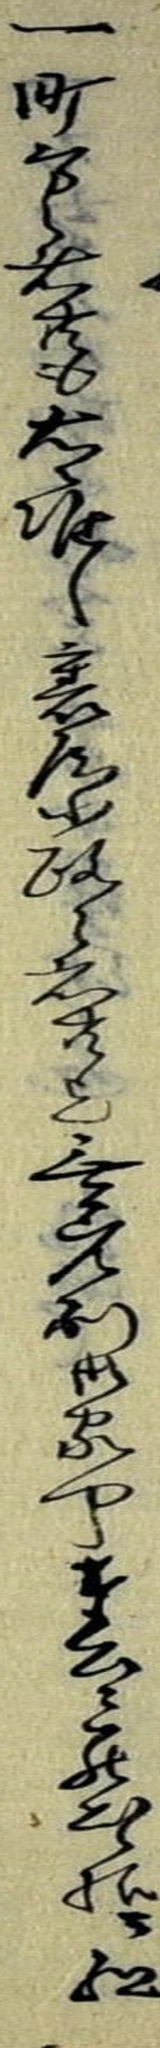一町方之者共も右に准し裏屋小路之者共迄無差別御家中奉公に罷出候様に組
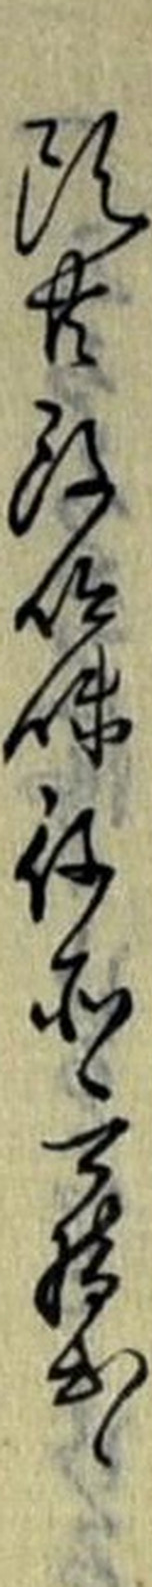頭共致吟味役所へ可指出候
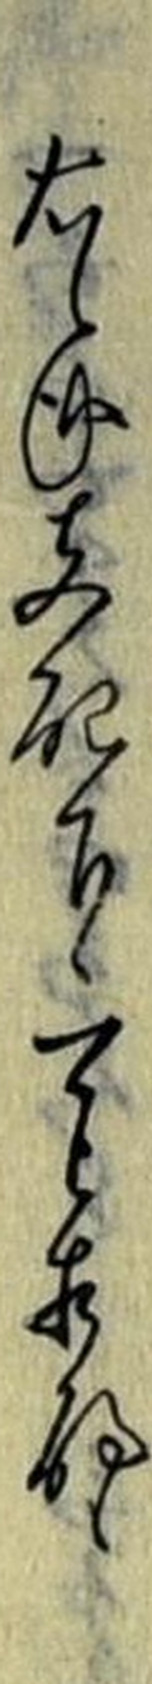右之趣支配下へ可被相触候
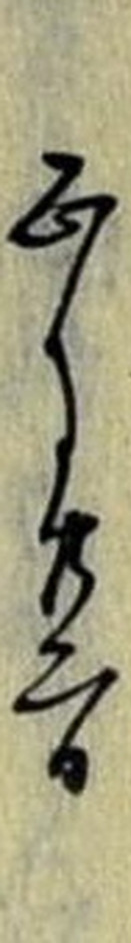正月廿二日
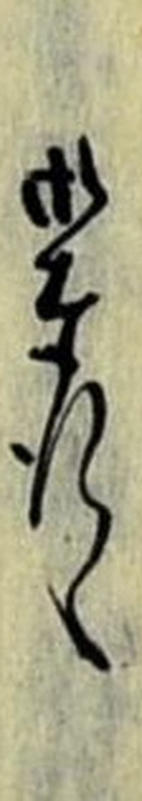御奉行へ
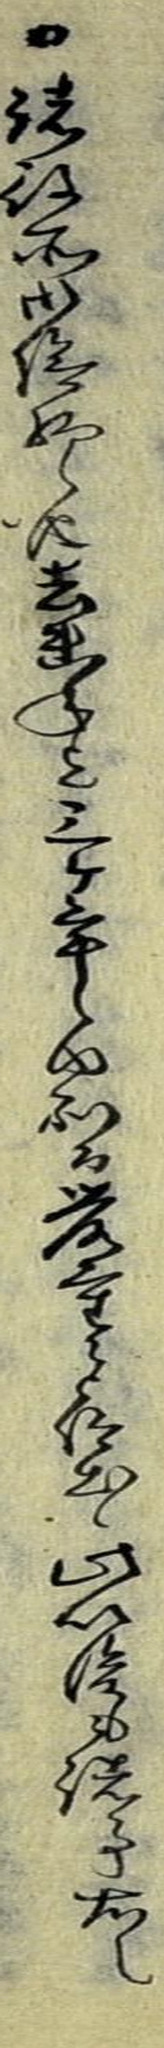〇諸役所御倹約之儀去未年迄三ヶ年之内別而厳重に被仰出候此以後も諸事右之
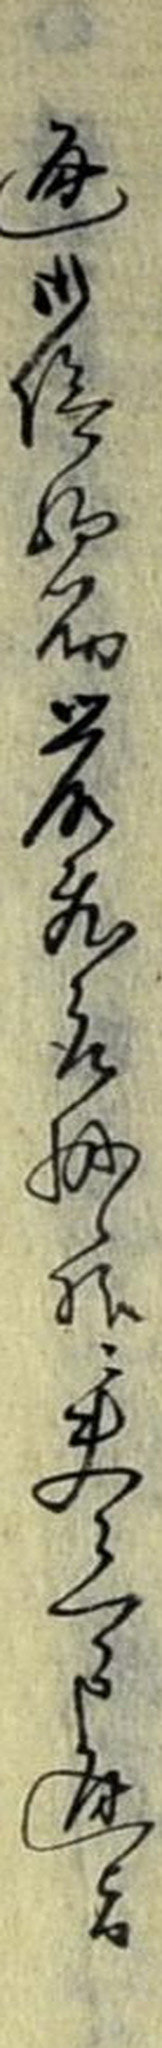通御倹約筋厳敷取扱候様に夫々可申通旨
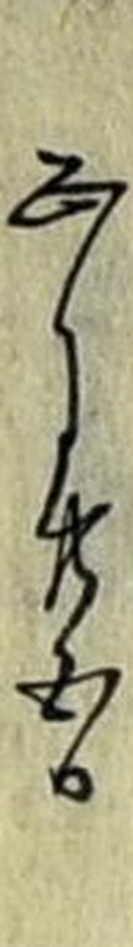正月廿五日
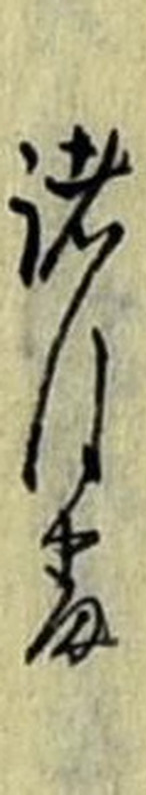諸月番
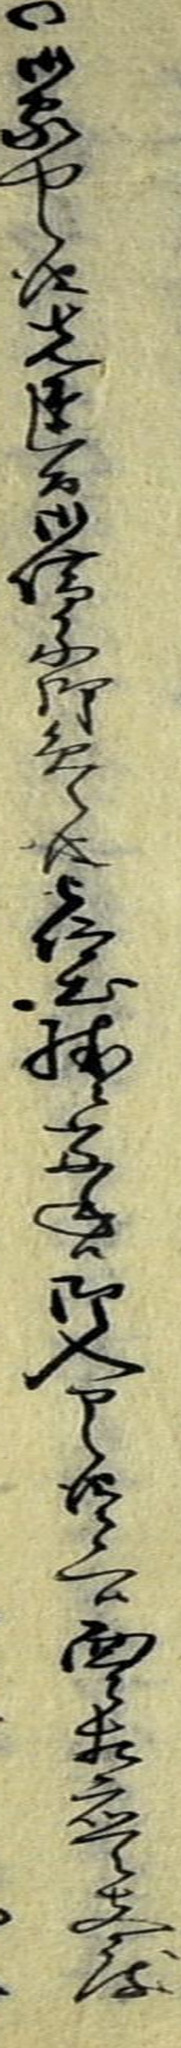〇御家中之儀先達而御借米御免之儀被仰出殊に当年は御入部之儀に候へは面々相応之支度
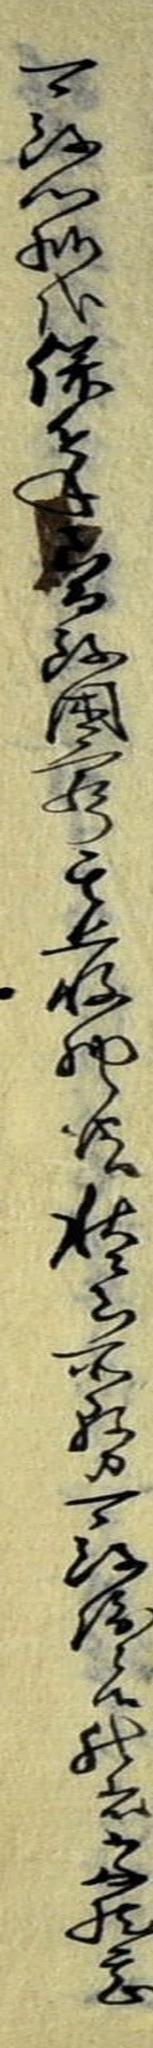可致心掛哉併近年而致困窮其上収納之儀は秋に至所務可致儀に候然者当然甚

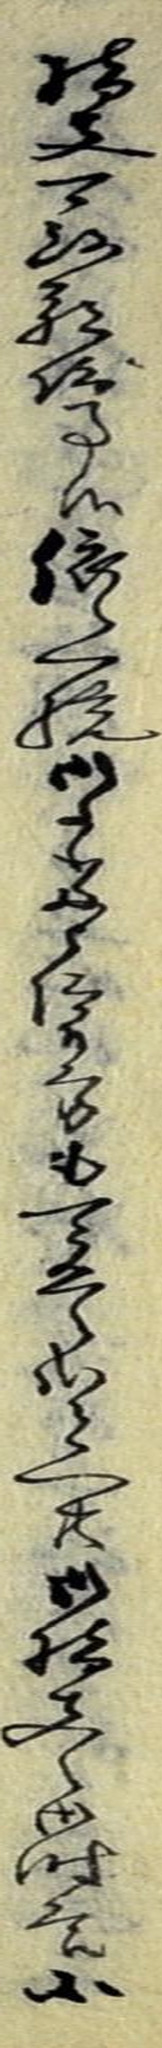指支可致難儀事候依之一統御手当被仰付方も可有之哉に候へ共御指支之御時節不
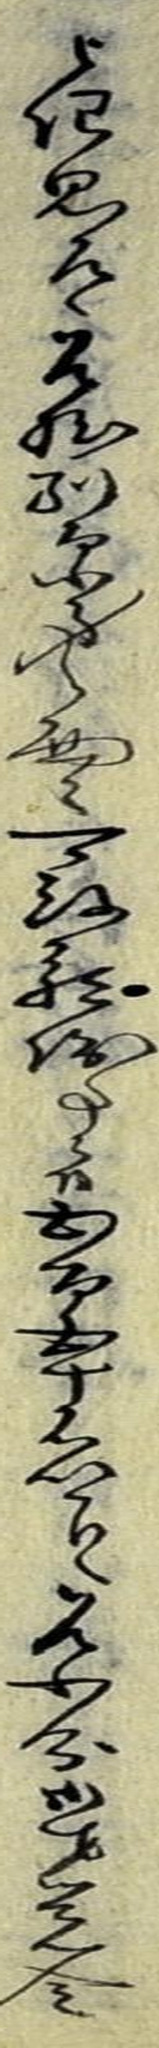被任思召候乍然別而小身之面々可致難儀事に付五百五十石以下へ乍少分御才覚金
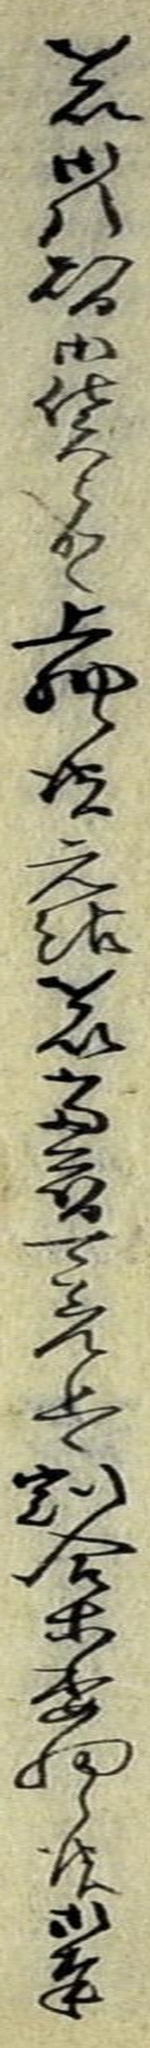を以御引替御貸被成候上納之儀は元銀を以当暮可差上候割合等委細之儀は御奉
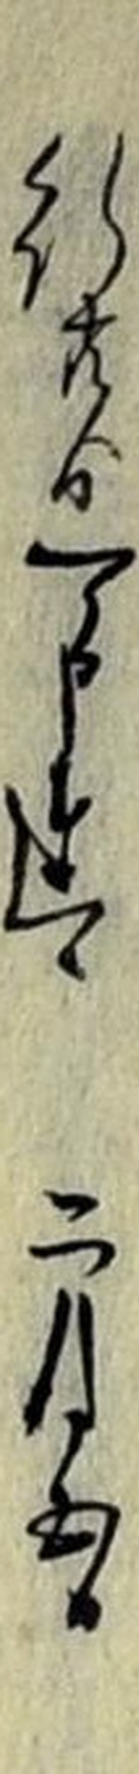行共ゟ可申達候二月五日
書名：命令之部 二
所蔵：福井県文書館 Fukui Prefectural Archives
